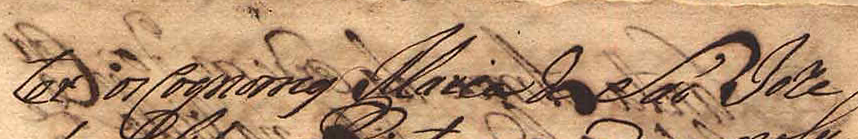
ter os Cognomes Maria de Saõ Ioze
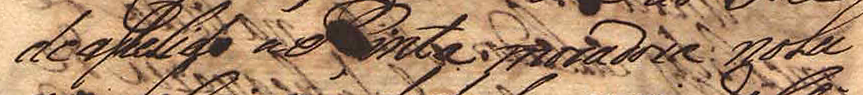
de appelido a Pinta moradora no Lu
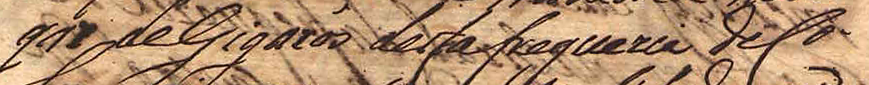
gar de Gigaros desta freguezia de Co
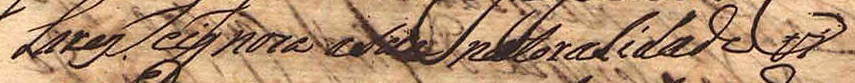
Lares e ignora a sua naturalidade vi
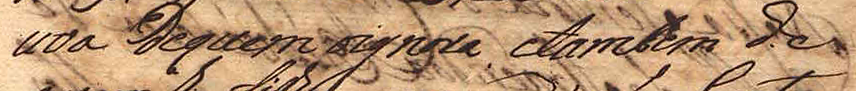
uva de quem o ignora e tambem de
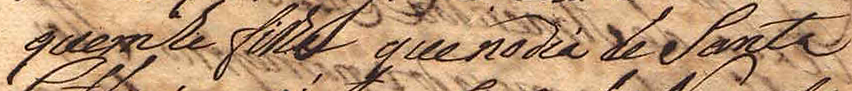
quem he filha que no dia de Santa
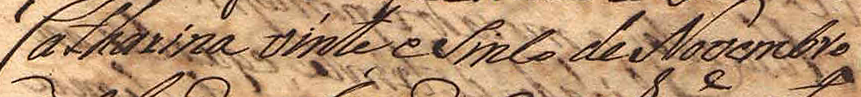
Catharina vinte, e sinCo de Novembro
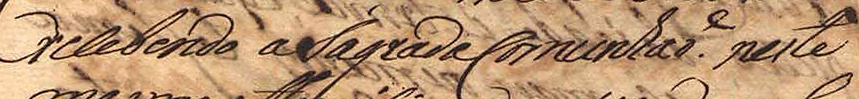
recebendo a Sagrada Comunhaõ. neste
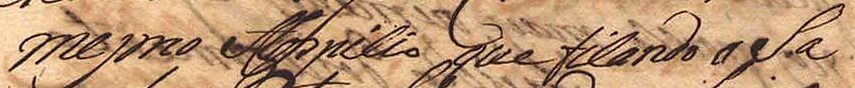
mesmo HospiCio que fiCando a Sa
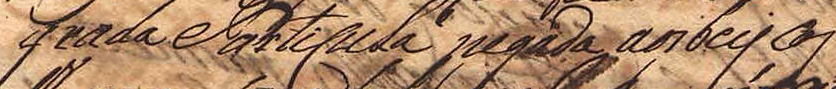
grada PartiCula pegada aos beisços
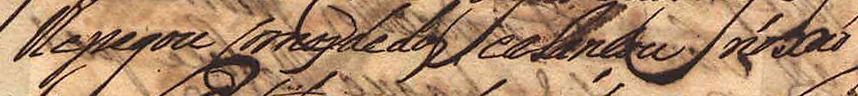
lhe pegou Com os dedos e a lançou no xaõ
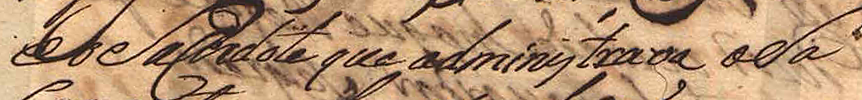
e o SaCerdote que administrava o Sa
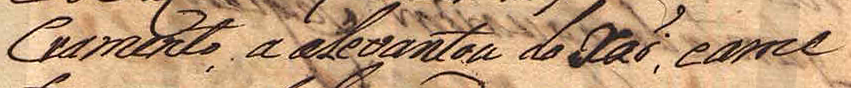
Cramento, a alevantou do xaõ, e a me
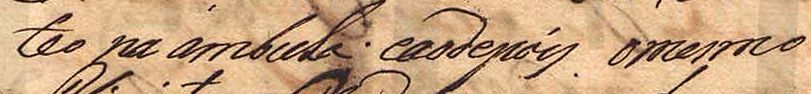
teo na ambula; e ao depois o mesmo
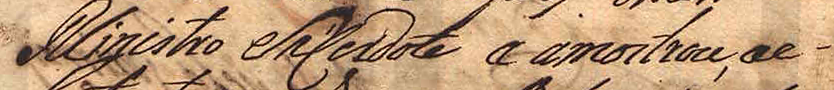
Ministro SaCerdote a amostrou, a e
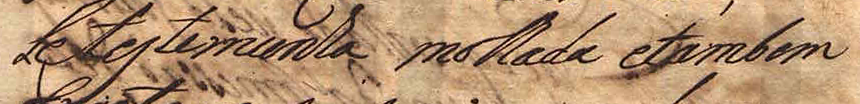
le testemunha molhada e tambem
